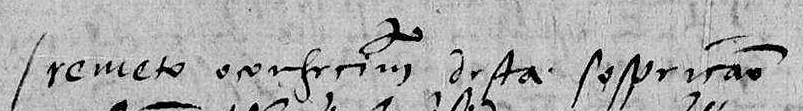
/ remeto o conhecimto desta. sospeição
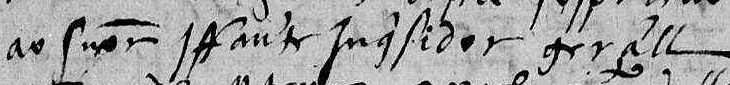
ao snōr Jffante Jnqisidor gerall
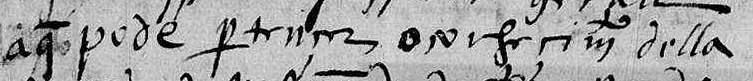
a q̄ pode ꝑtencer o conhecimto della
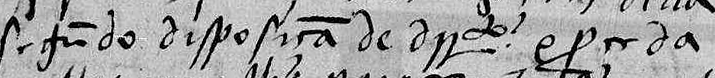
segūdo disposiçā de drrto. e ꝓceda
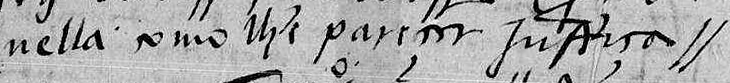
nella. como lhe parecer Justiça //
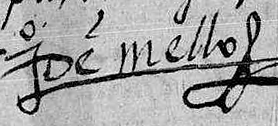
Jo de mello
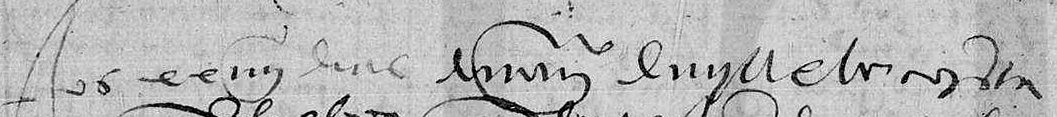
Aos xxiiij dias de nouro de mjll e vc corēta
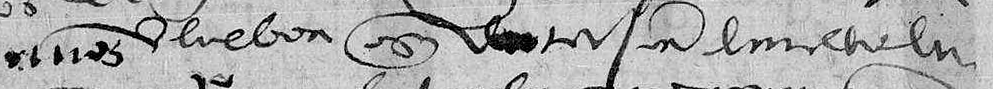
an̄os ē lixboa o s̄r doctor Jm̄ de mello deu
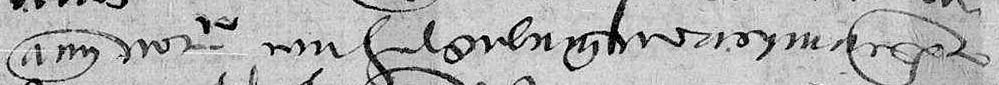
a mj̄ notro com ho desenbarguo asyma esp̄to
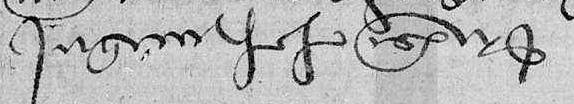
Jorge coelho ho esp̄vy
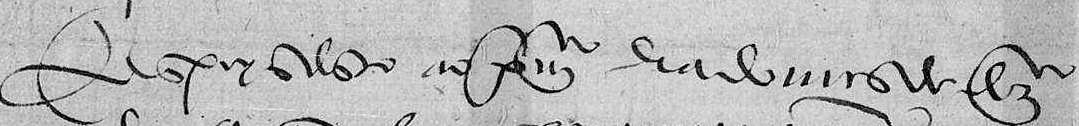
E despoys desto ao p̄mro dia do mes de dezro
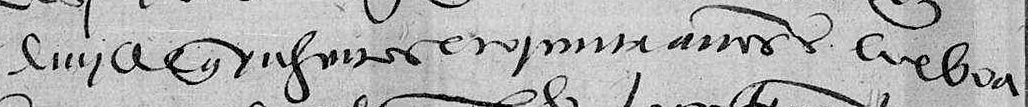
de mjll e q̄ynhentos e coremta an̄os ē lixboa
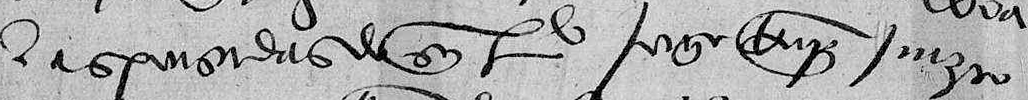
ē as pousadas do s̄r Ldo Jorge Rūjz Juiz co
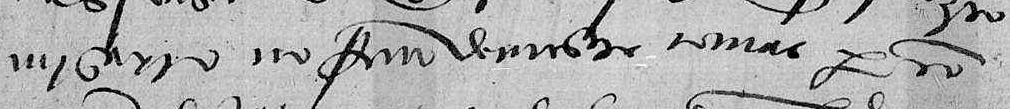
mjsayro no feito de meste tomas ꝑ c̄o
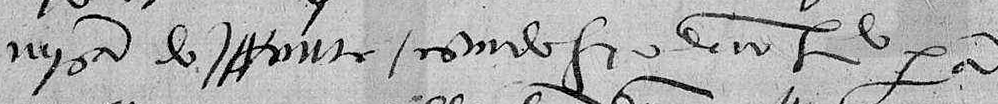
mjsā do Jffante / estado hy o dito Ldo ꝑā
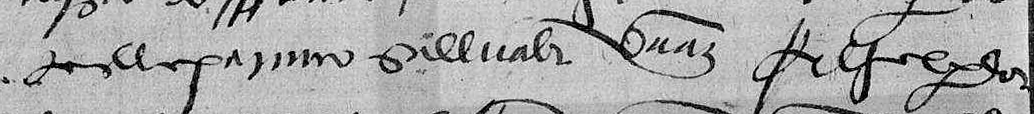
te elle pareceo salluador vāaz fylho e ꝑdor
